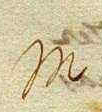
m
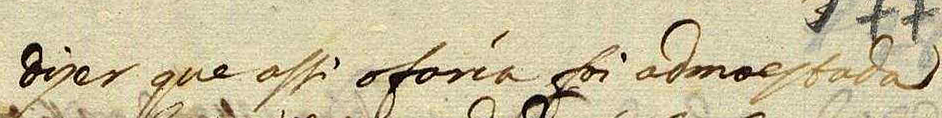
dizer que assi o faria foi admoestada
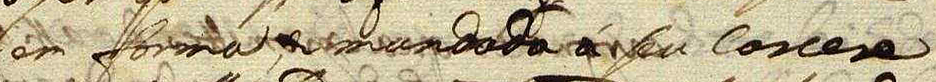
em forma, E mandada a seu carcere
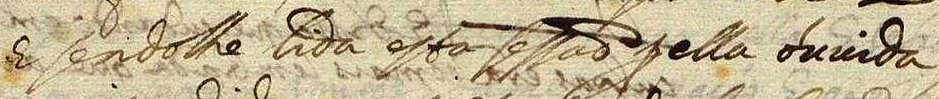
E sendolhe lida esta sessaõ ꝓ ella ouuida,
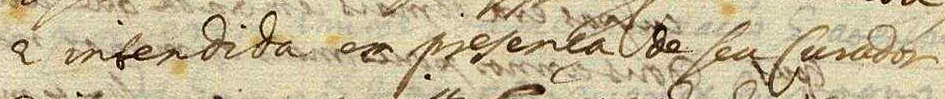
E intendida em presença de seu Curador
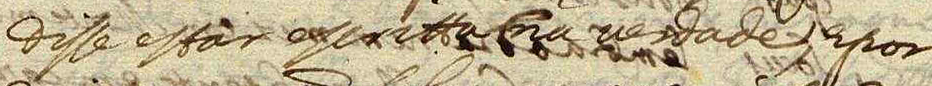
disse estar escritta na uerdade E por
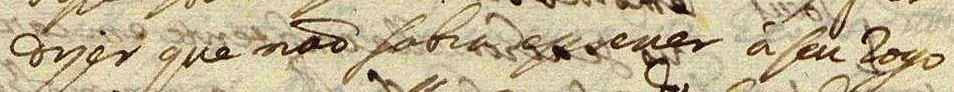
dizer que não sabia escreuer a seu Rogo
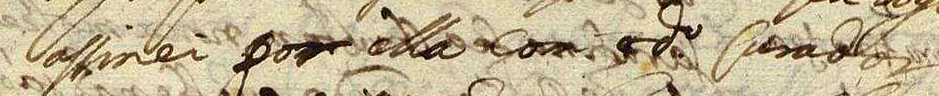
assinei por ella com o d.o Curador
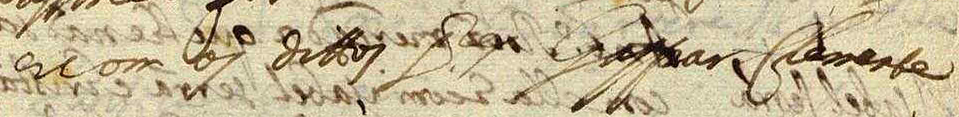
E com os dittos pres Gaspar Clemente
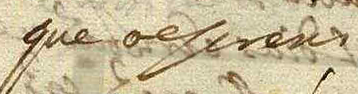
que o escreui
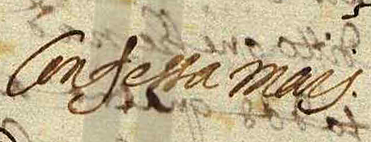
Confessa mais.
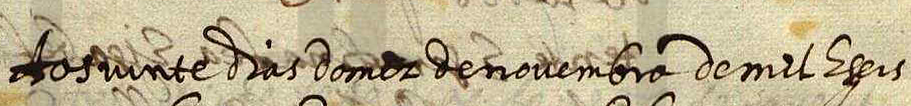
Aos uinte dias do mez de nouembro de mil E seis
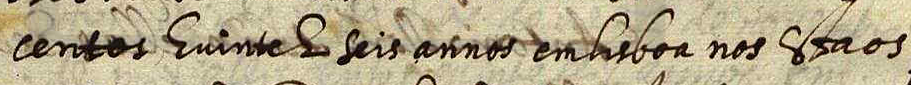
centos E uinte E seis annos em lisboa nos estaos
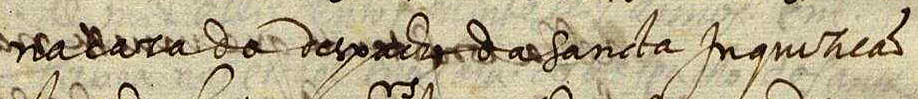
na caza do despacho da sancta Jnquiziçaõ
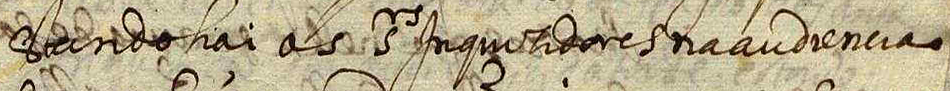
estando hai os srs Jnquizidores na audiencia
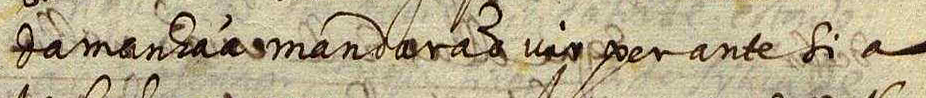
da manhaā mandaraõ uir perante si a
